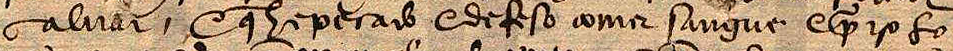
saluar , e q̄ he pecado e defeso comer sangue e p̄o iso ho
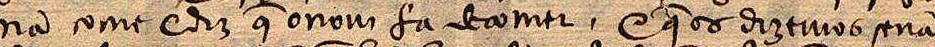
nā come e diz q̄ o nom ha de comer , e q̄ os dizemos se nā
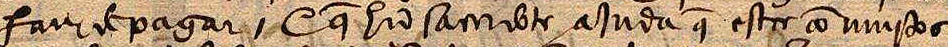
ham de pagar / e q̄ hū sacerdote aJnda q̄ estee c̄o mujtos
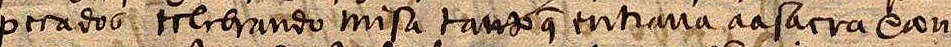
pecados celebrando misa tanto q̄ entraua aa sacra e con
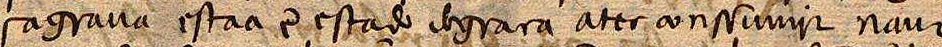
sagraua estaa ē estado de graça atee conssumjr nam
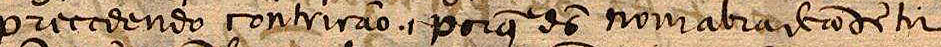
precedendo contricão ., porq̄ ds̄ nom avia de c̄osētir
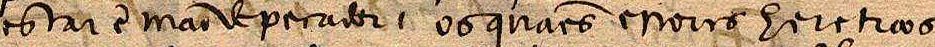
estar ē mão de pecador , os quaes errores hereticos
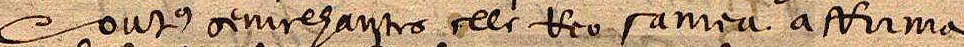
e outꝯ semelhantes elle Reo samea. affirma
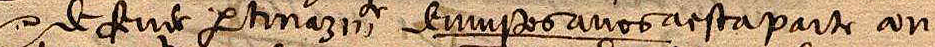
e defende ꝑtinazmte de mujtos anos a esta parte con
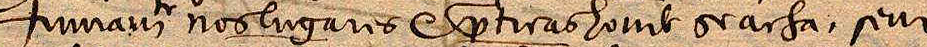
tinuamte nos lugares e p̄ticas honde se acha , sem
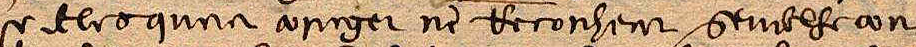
se delo querer correger nē Reconheçer sendolhe con
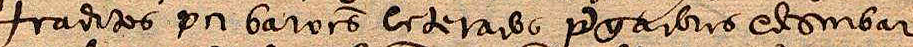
traditos per barões leterados p̄gadores e desembar
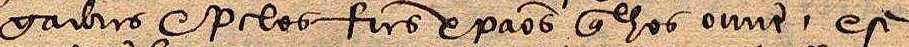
gadores e pelos fies xpaõs q̄ lhos ouuē , e se
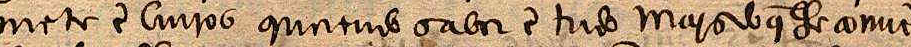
mete ē liuros querendo saber ē tudo majs do q̄ lhe conuē
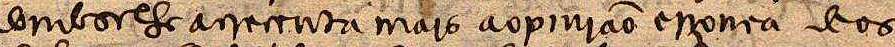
donde se lhe acreçenta majs a opinjão erronea de os
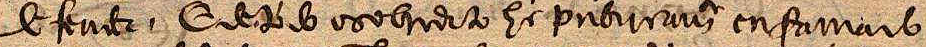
defender , E de todo o sobredito he pubrjcamte enfamado
